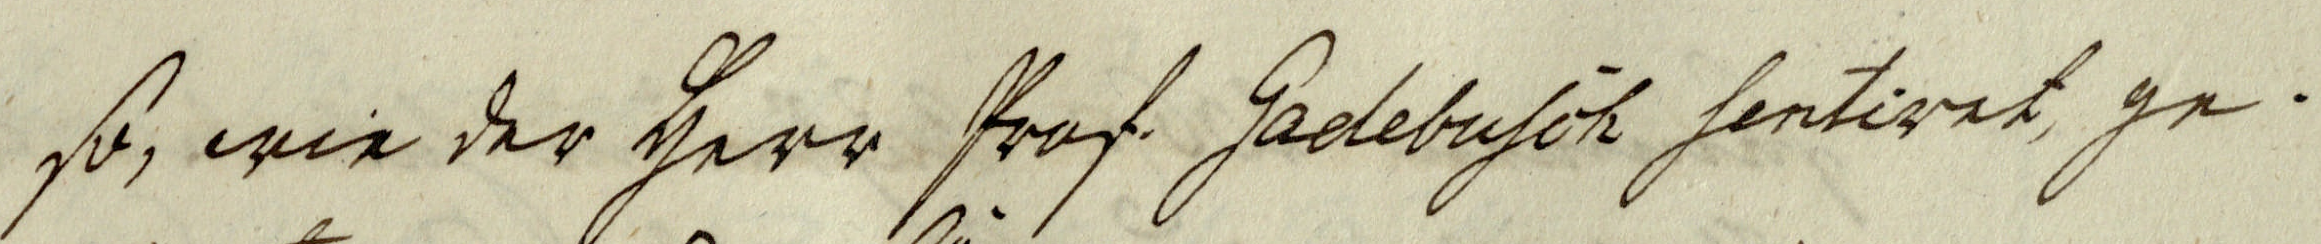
so, wie der Herr Prof. Gadebusch sentiret, ge¬
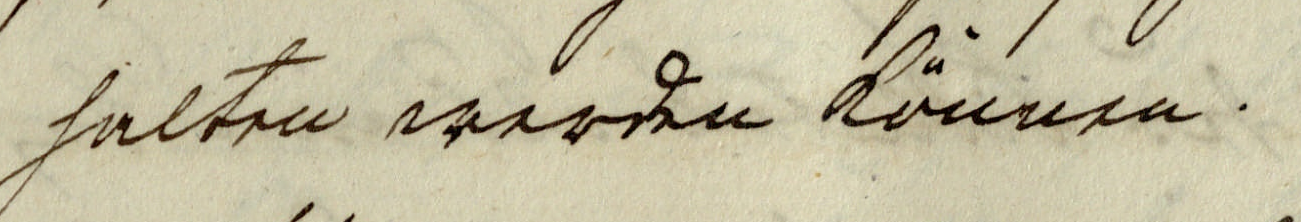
halten werden können.
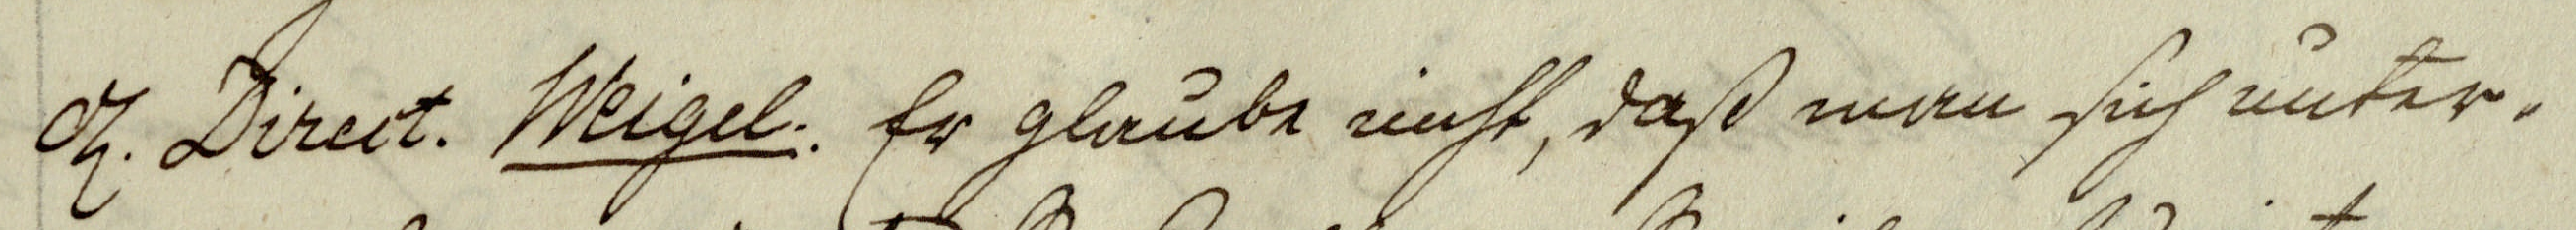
dh. Direct. Weigel: Er glaube nicht, daß man sich unter¬
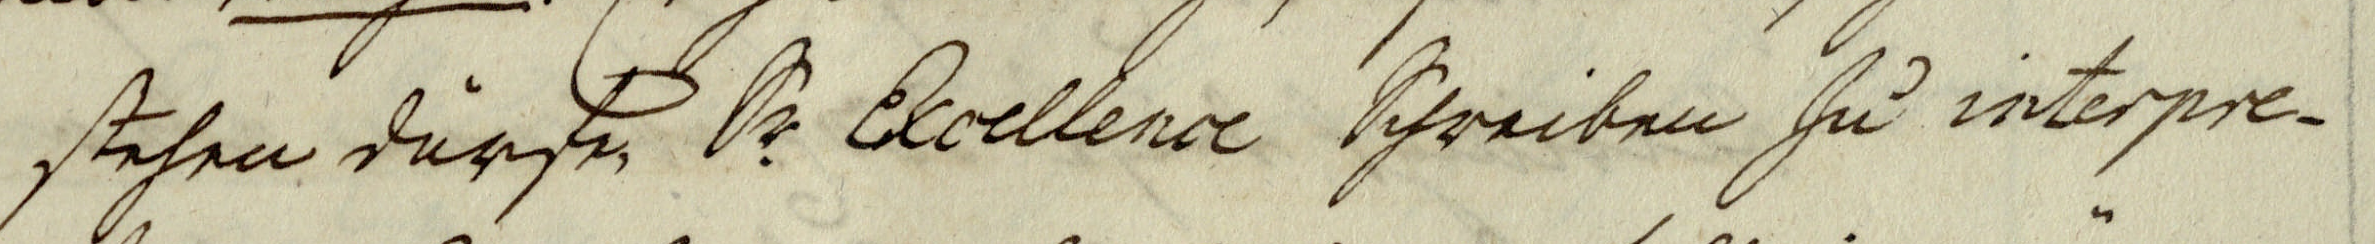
stehen dürfe, Sr. Excellence Schreiben zu interpre¬
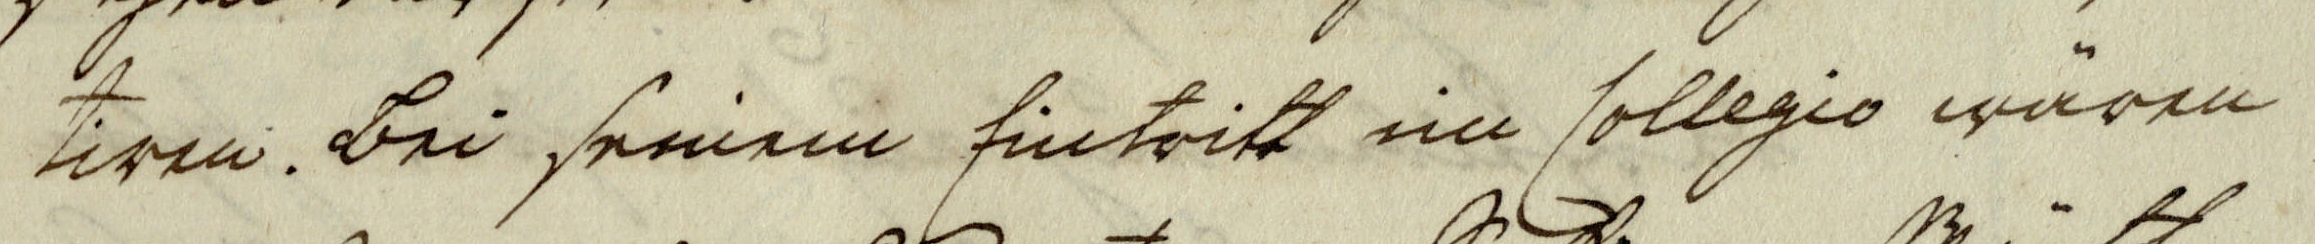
tiren. Bei seinem Eintritt im Collegio wären
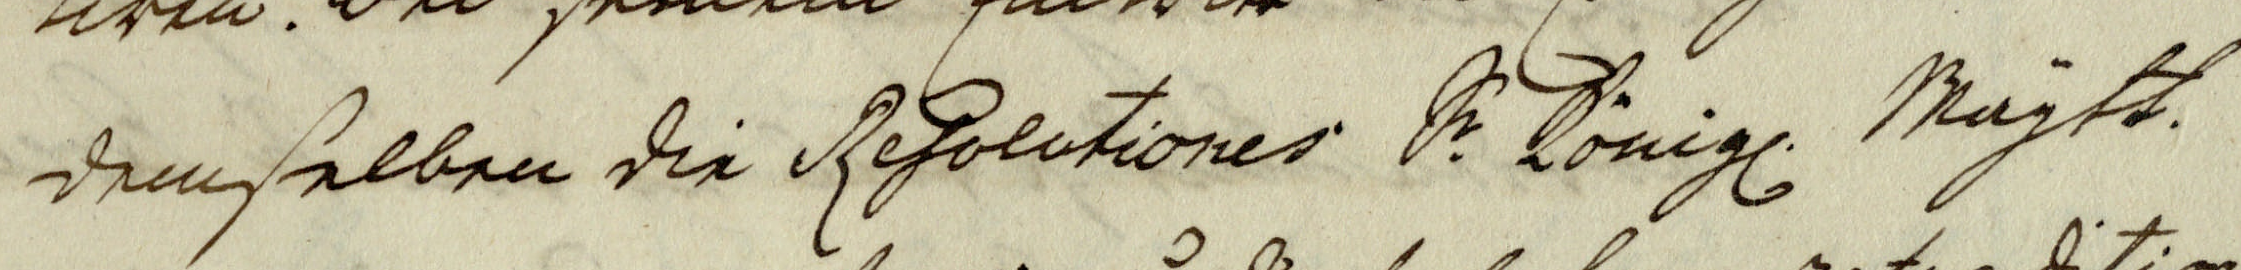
demselben die Resolutiones Sr. Königl. Maÿst.
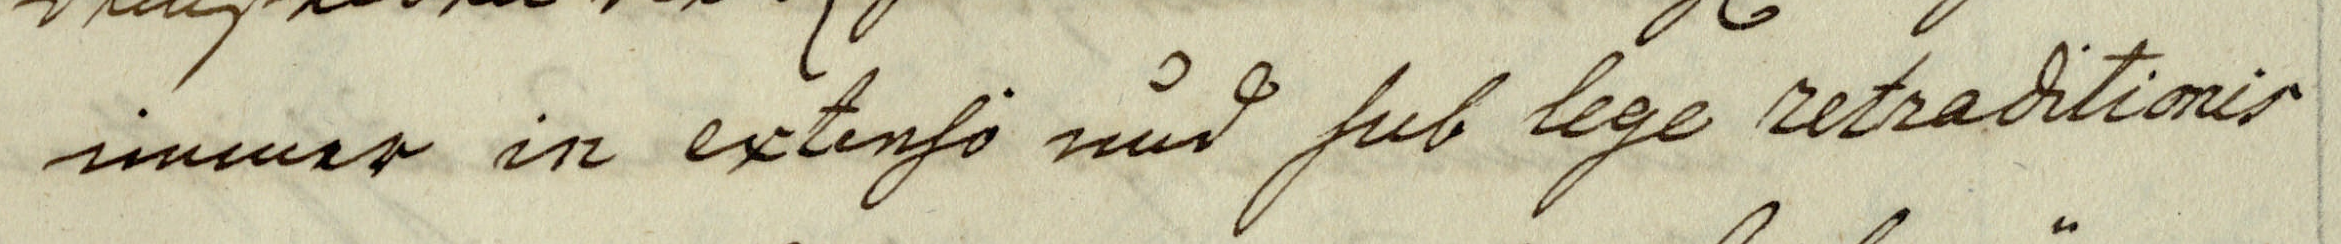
immer in extenso und sub lege retraditionis
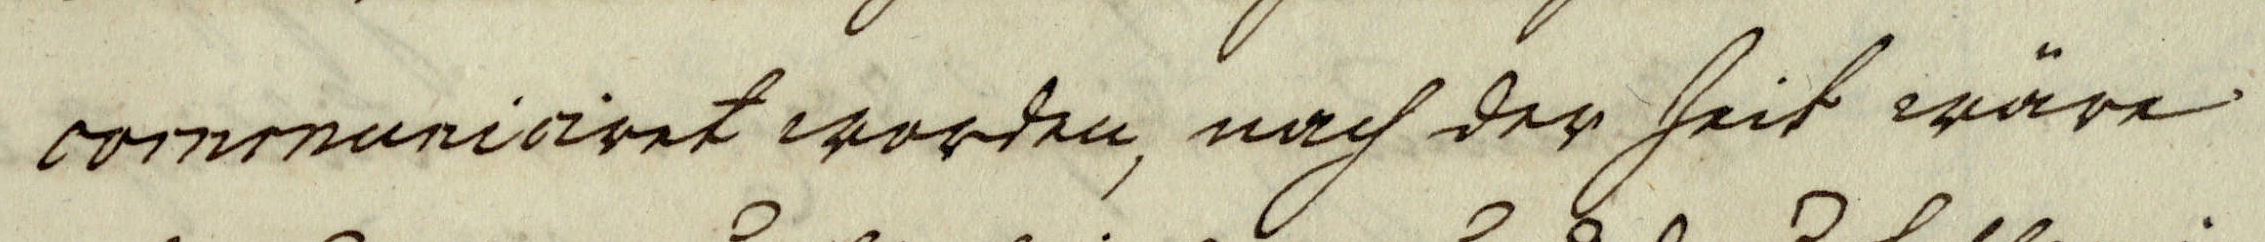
communiciret worden, nach der Zeit wäre
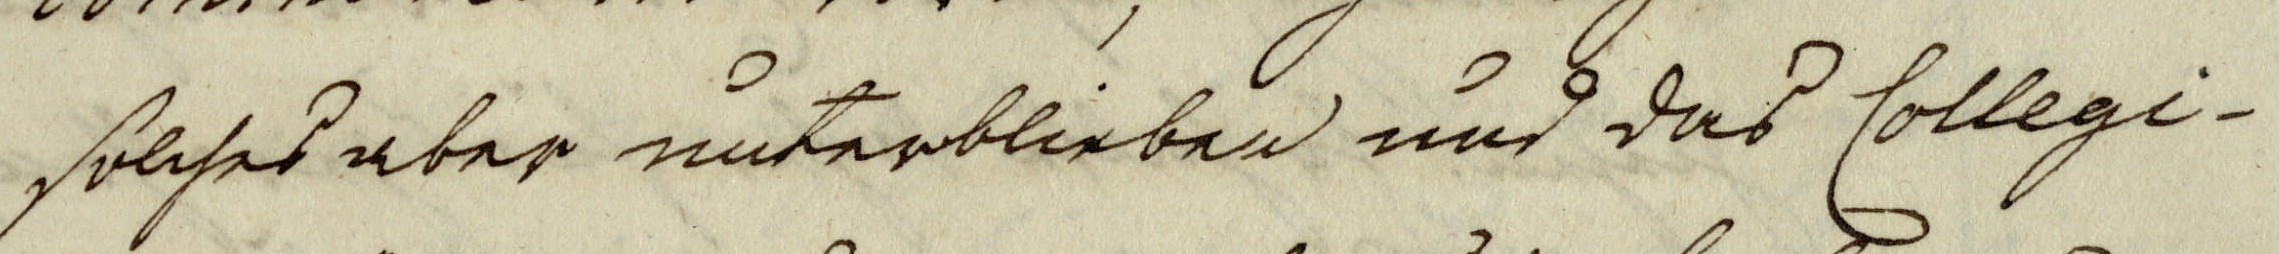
solches aber unterblieben und das Collegi¬
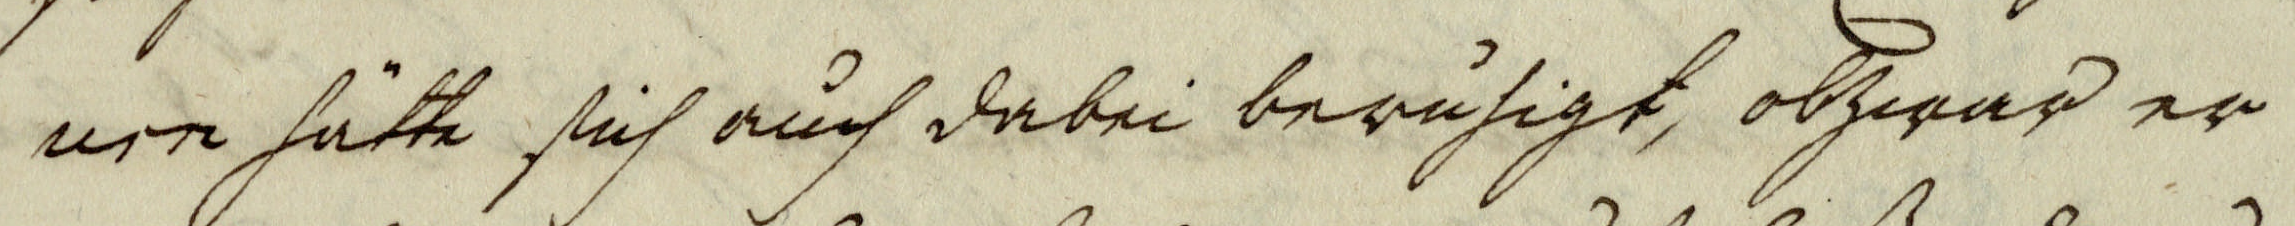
um hätte sich auch dabei beruhigt, obzwar er
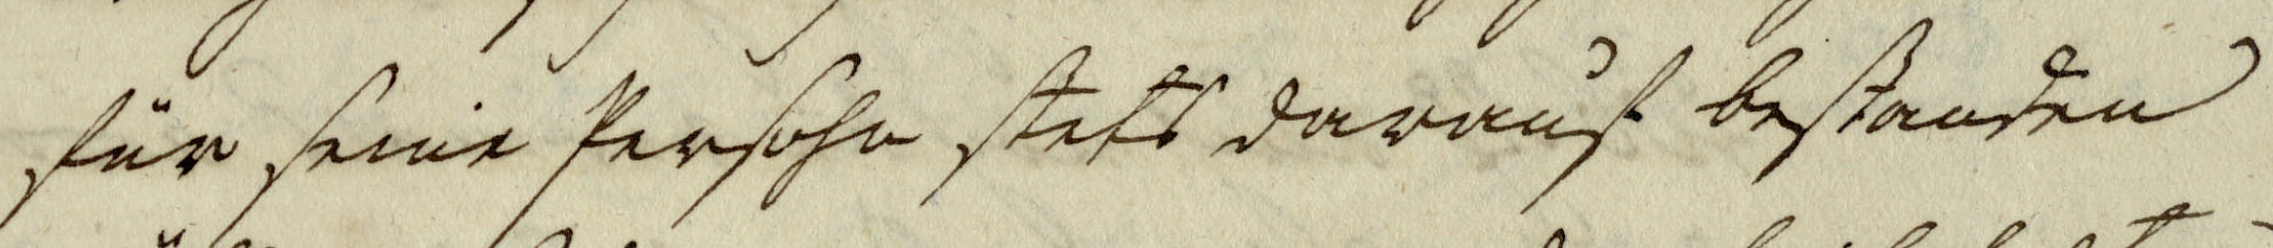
für seine Persohn stets darauf bestanden
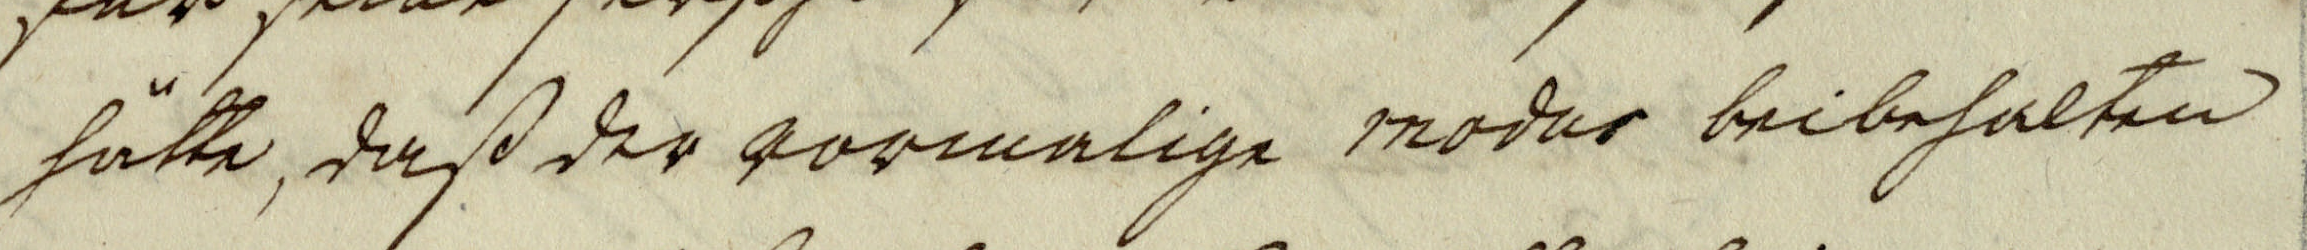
hätte, daß der vormalige modus beibehalten
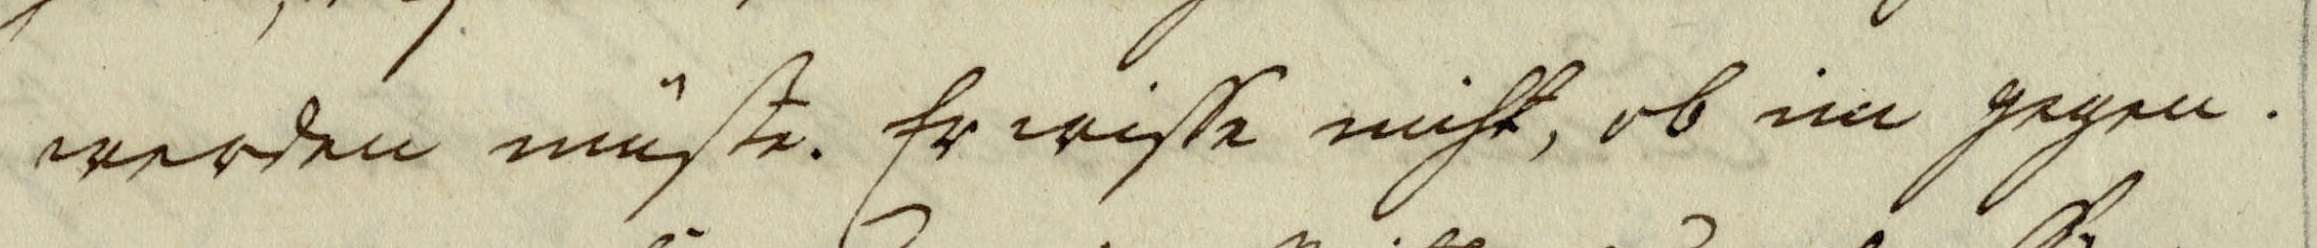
werden müsste. Er wisse nicht, ob im gegen¬
